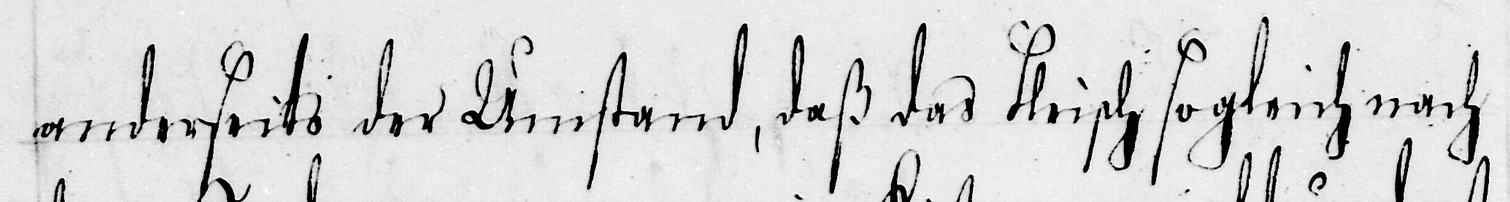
anderseits der Umstand, daß das Fleisch sogleich
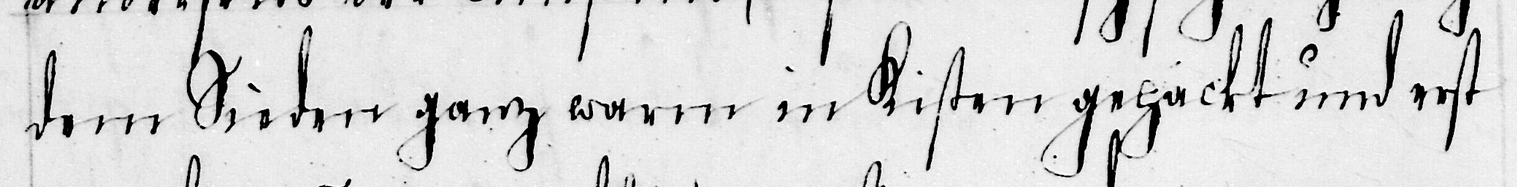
dem Sieden ganz warm in Kisten gepackt und erst
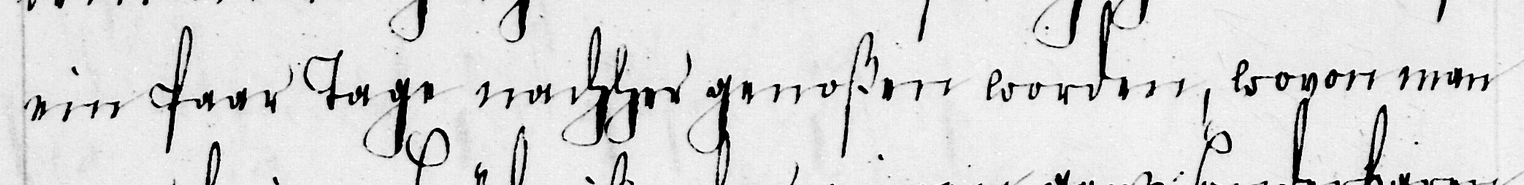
ein Paar Tage nachher genoßen worden, wovon man
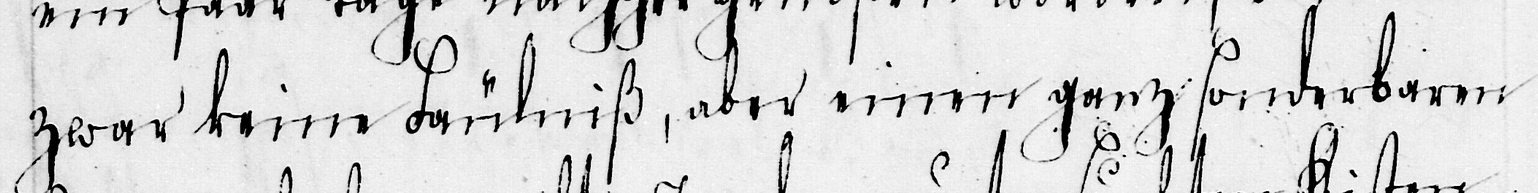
zwar keine Fäulniß, aber einen ganz sonderbaren
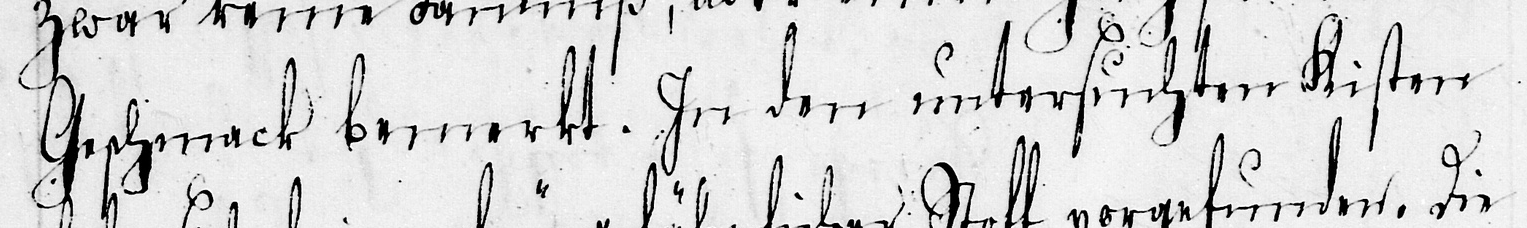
Geschmack bemerkt. In den untersuchten Kisten
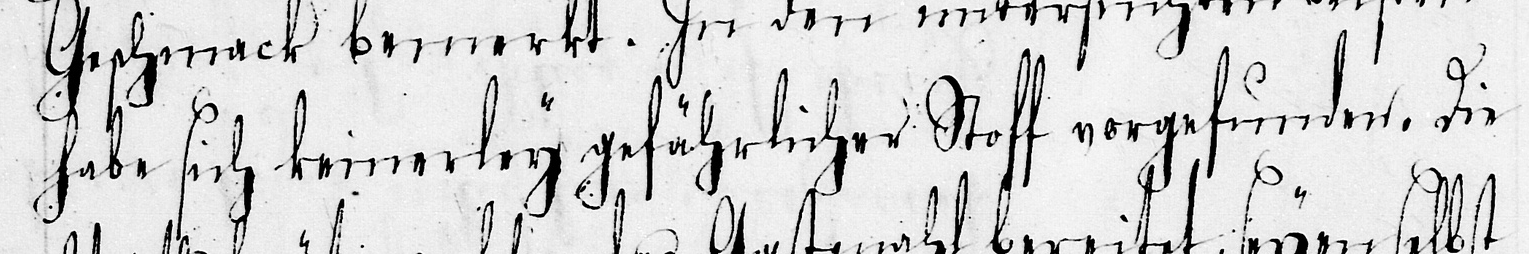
habe sich keinerley gefährlicher Stoff vorgefunden. Die
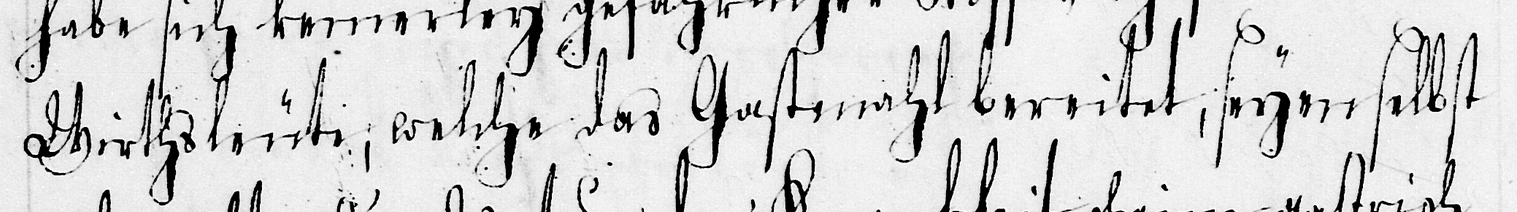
Wirthsleute, welche das Gastmahl bereitet, seyen selbst
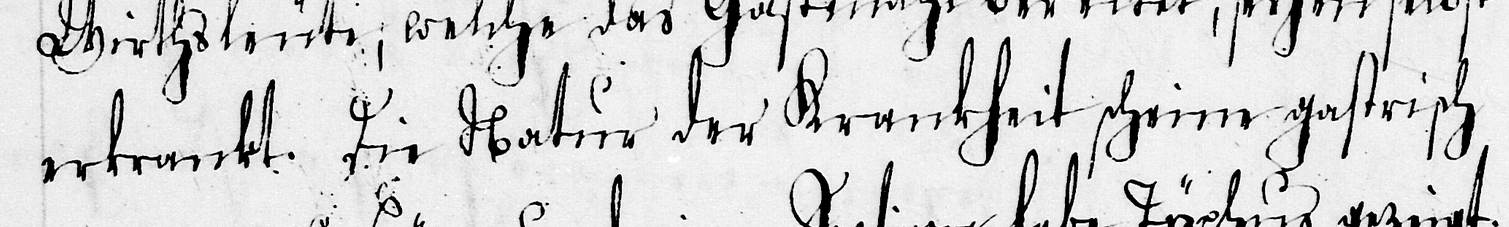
erkrankt. Die Natur der Krankheit scheine gastrisch
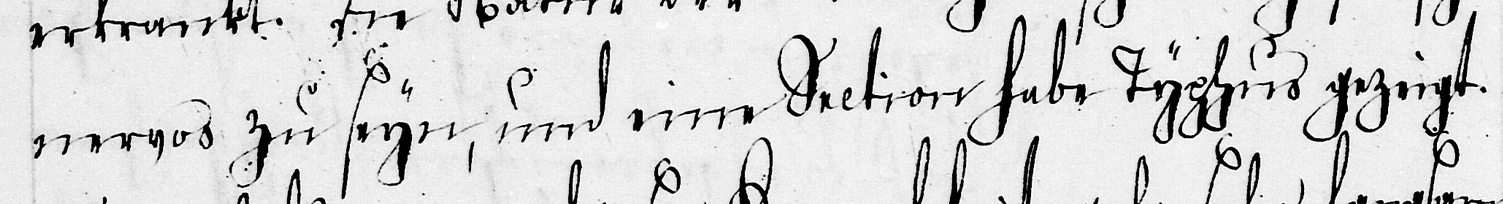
nervos zu seyn, und eine Section habe Typhus gezeigt.
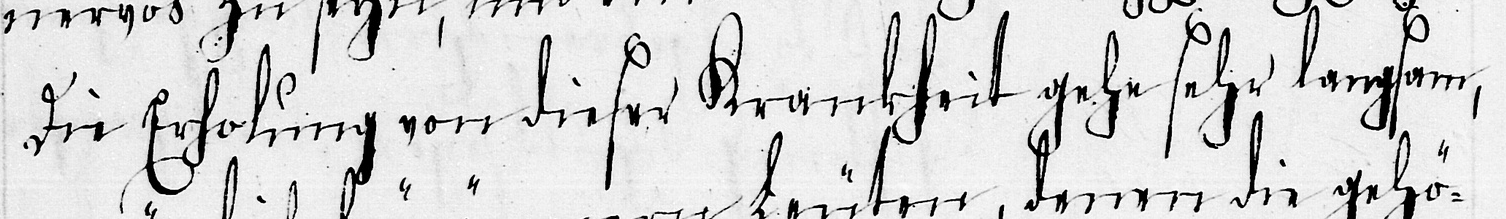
Die Erholung von dieser Krankheit gehe sehr langsam,
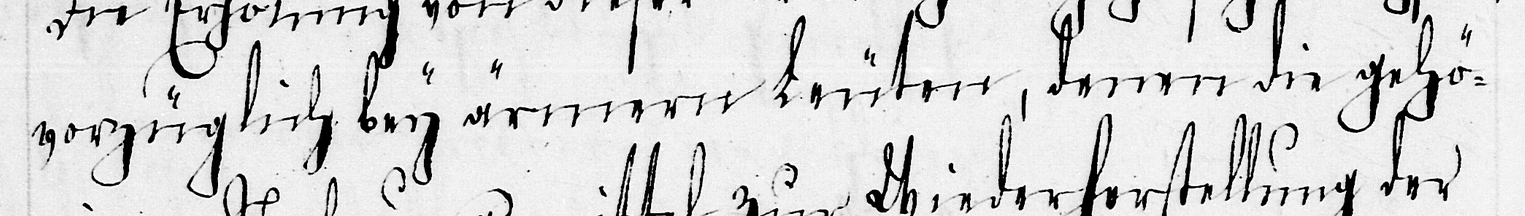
vorzüglich bey ärmern Leuten, denen die gehö¬
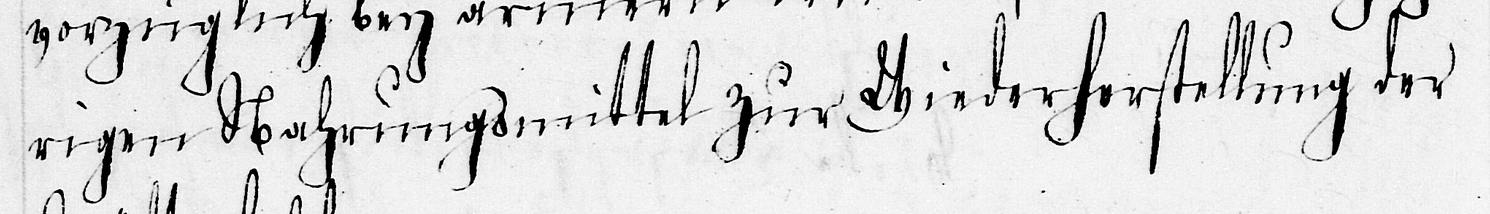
rigen Nahrungsmittel zur Wiederherstellung der
